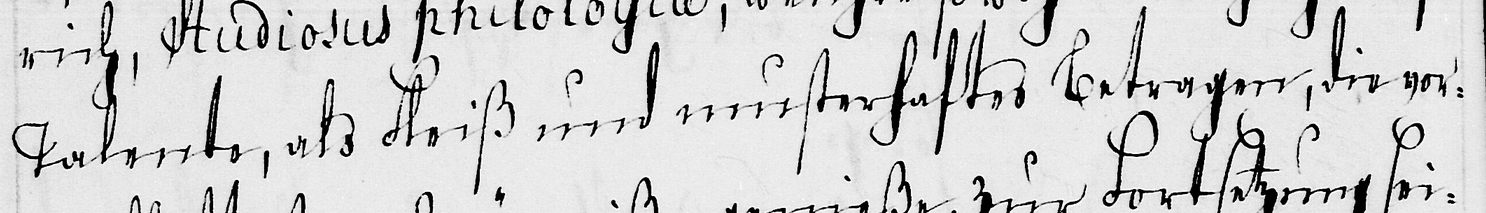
Talente, als Fleiß und musterhaftes Betragen, die vor¬
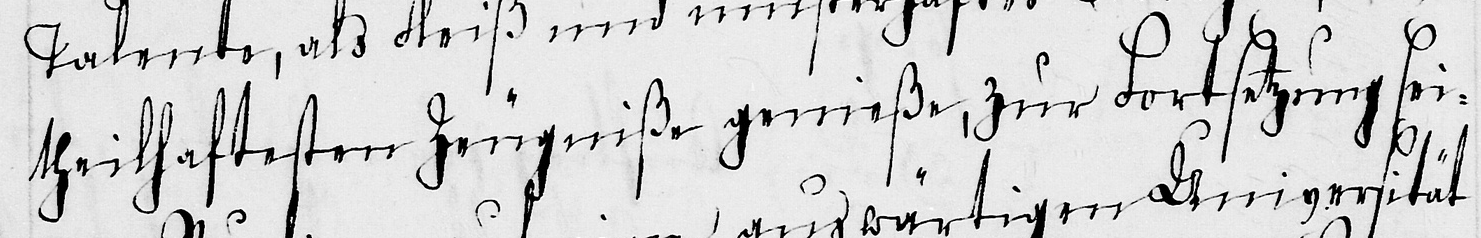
theilhaftesten Zeugniße genieße, zur Fortsetzung sei¬
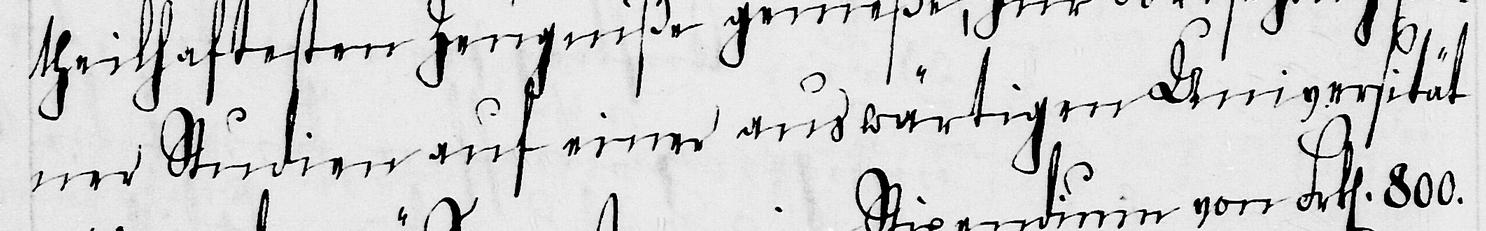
ner Studien auf einer auswärtigen Universität
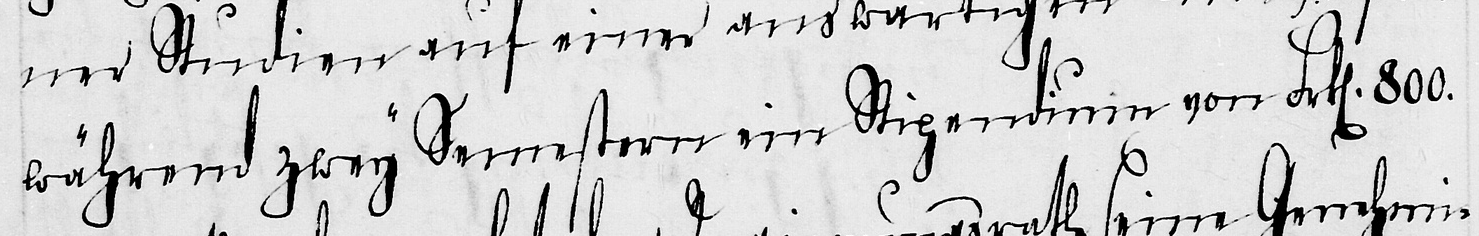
während zwey Semestern ein Stipendium von Frk. 800.
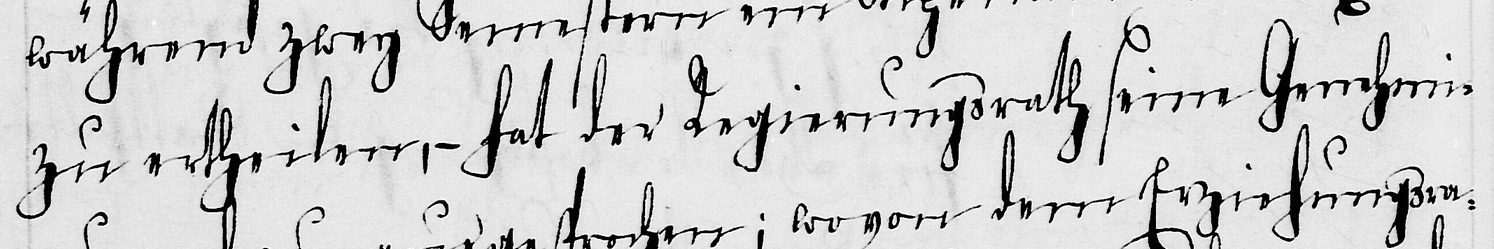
zu ertheilen, – hat der Regierungsrath seine Genehmi¬
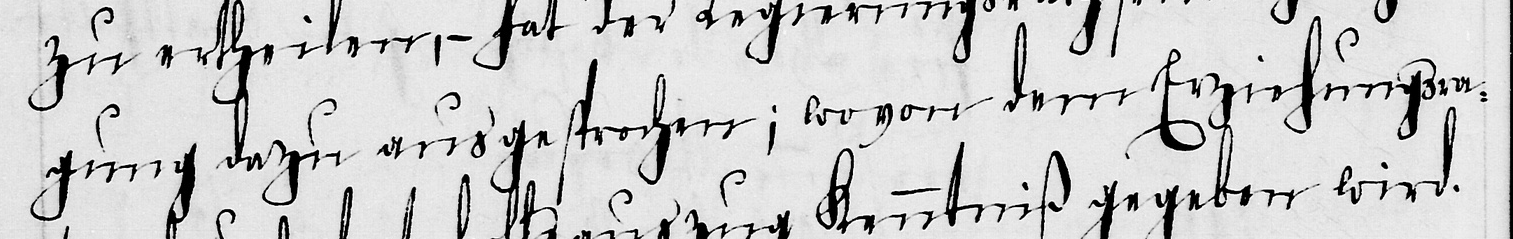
gung dazu ausgesprochen; wovon dem Erziehungsra¬
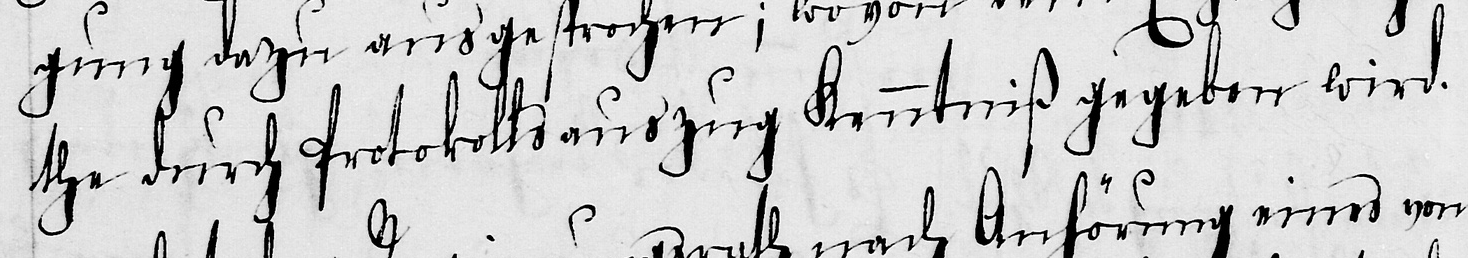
the durch Protokollsauszug Kenntniß gegeben wird.
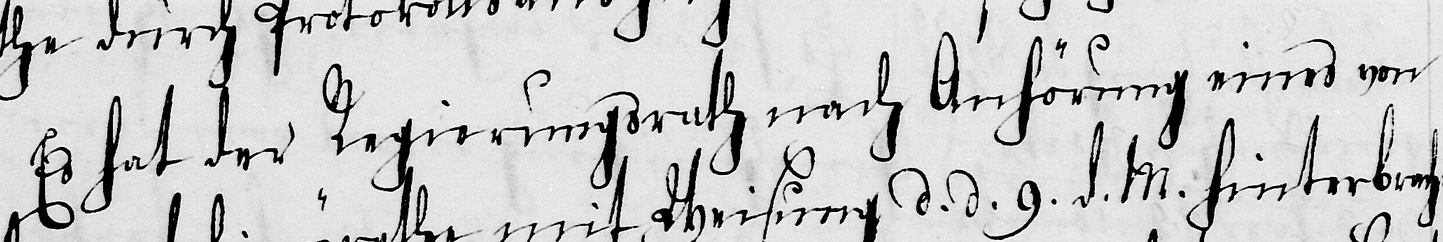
Es hat der Regierungsrath nach Anhörung eines von
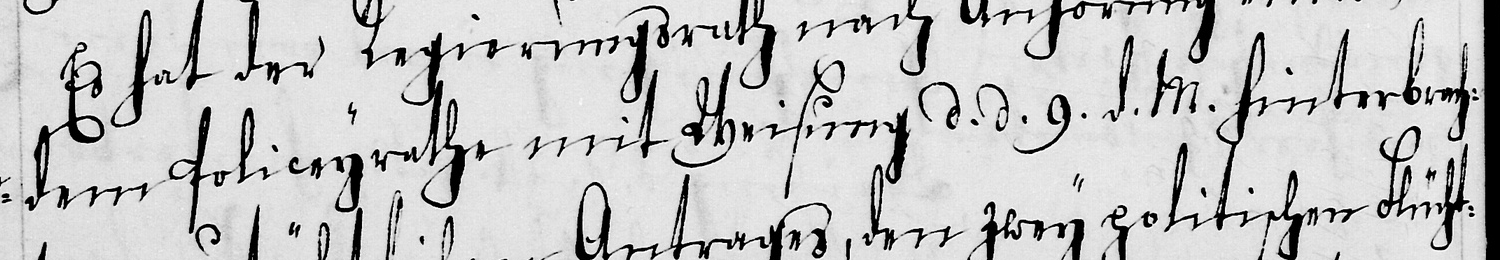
dem Policeyrathe mit Weisung d. d. 9. d. M. hinterbrac¬
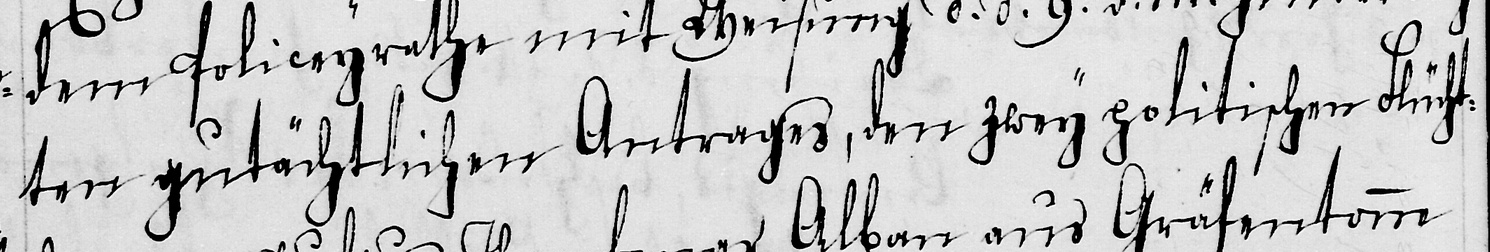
hten gutächtlichen Antrages, den zwey politischen Flüch¬
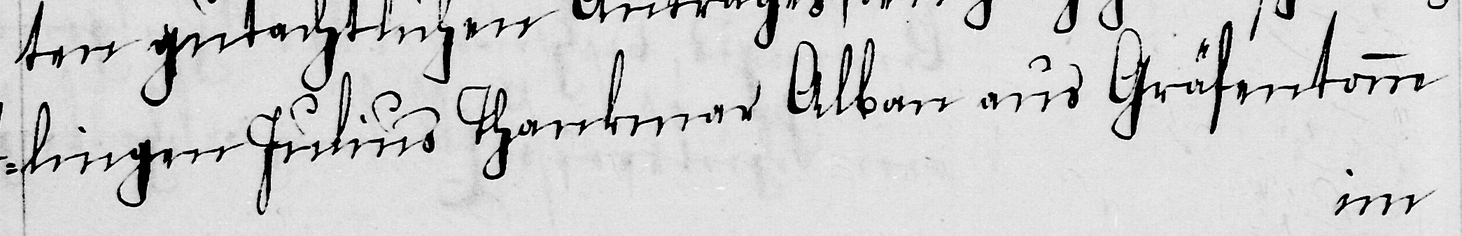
tlingen Julius Thankmar Alban aus Gräfentonne
